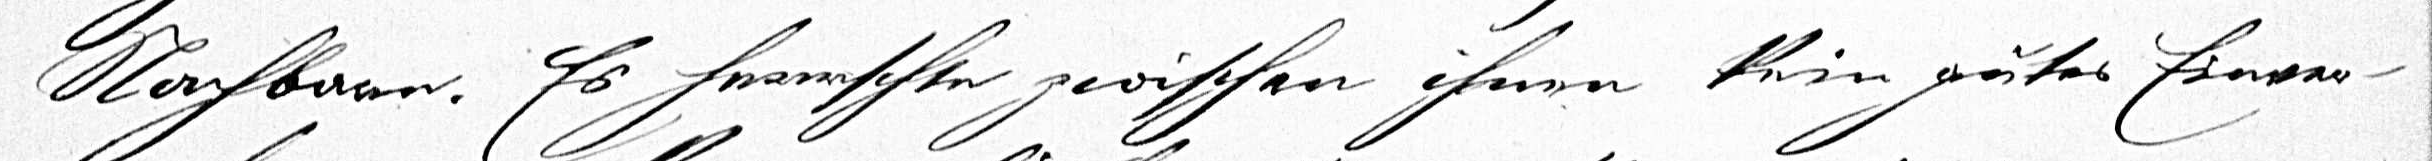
Nachbarn. Es herrschte zwischen ihnen kein gutes Einver¬
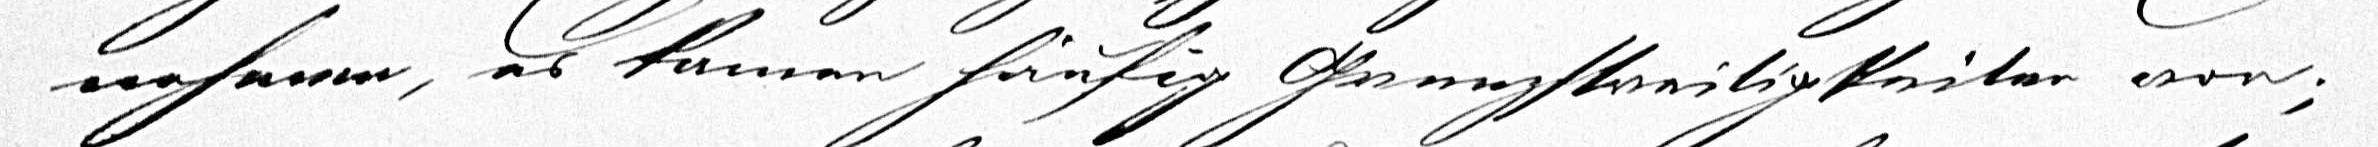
nahmen, es kamen häufig Grenzstreitigkeiten von;
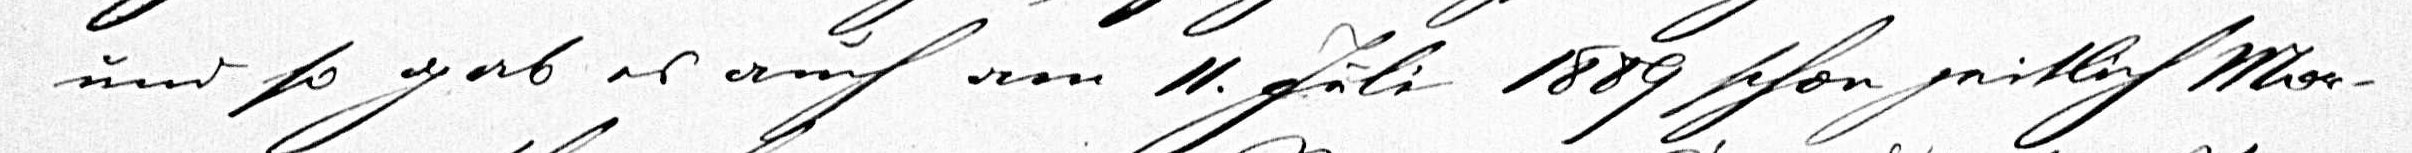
und so gab es auch am 11. Juli 1889 schon zeitlich Mor¬
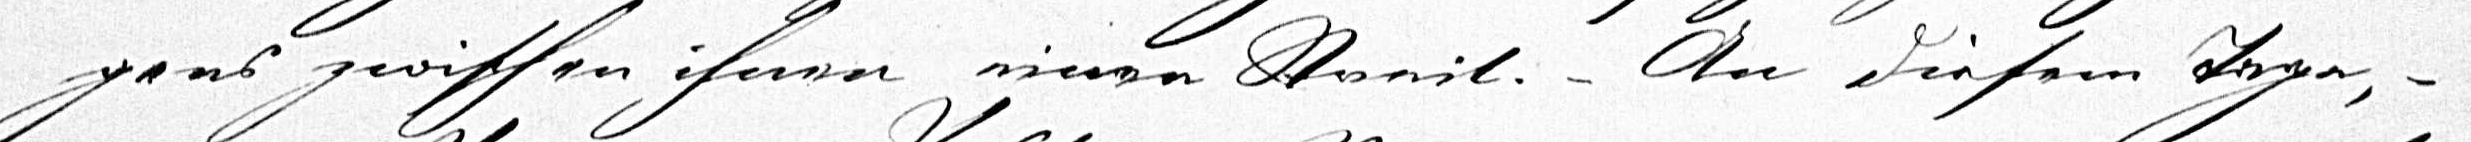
gens zwischen ihnen einen Streit. - An diesem Tage,-
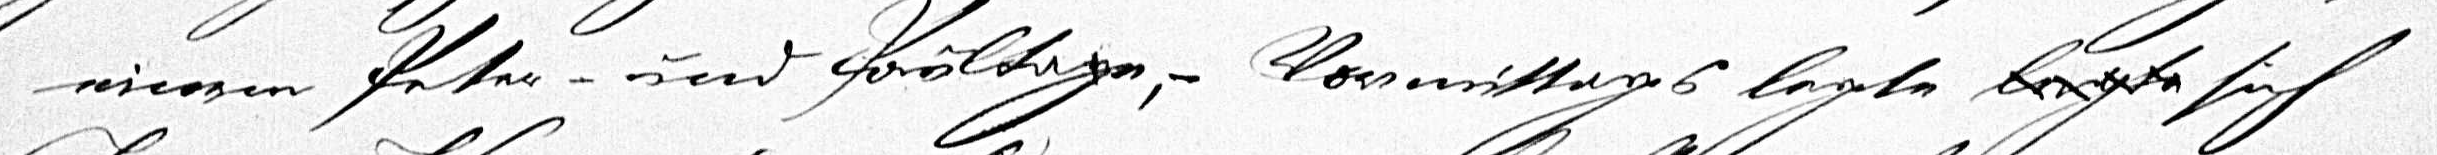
einem Peter- und Paultage,- Vormittags legte sich
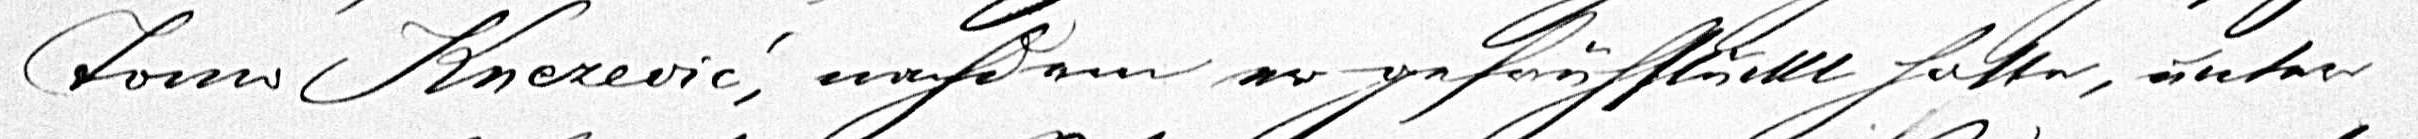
Tomo Knezević, nachdem er gefrühstückt hatte, unter
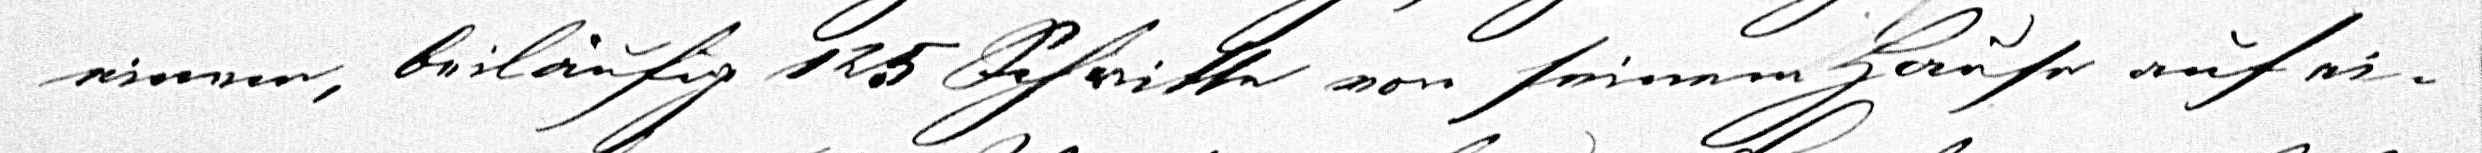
einem, beiläufig 125 Schritte von seinem Hause auf ei¬
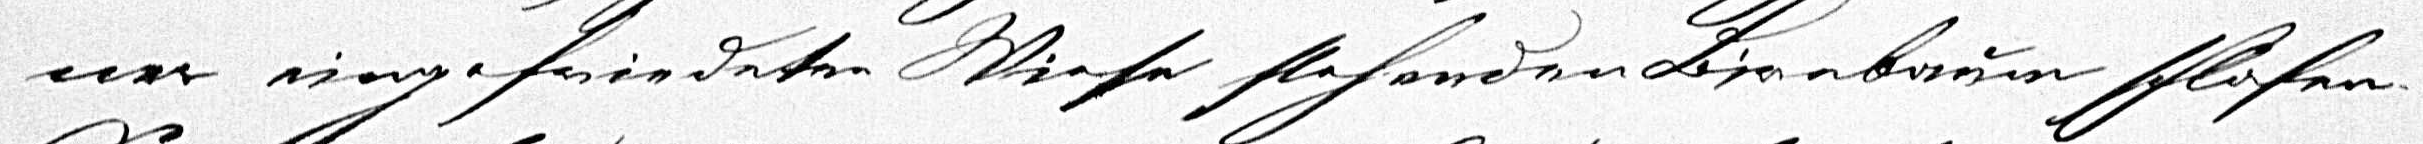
ner eingefriedeten Wiese stehenden Birnbaum schlafen.
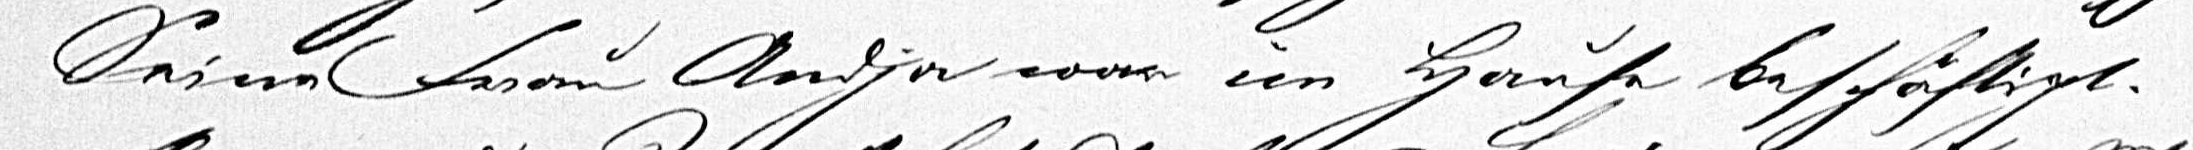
Seine Frau Andja war im Hause beschäftigt.
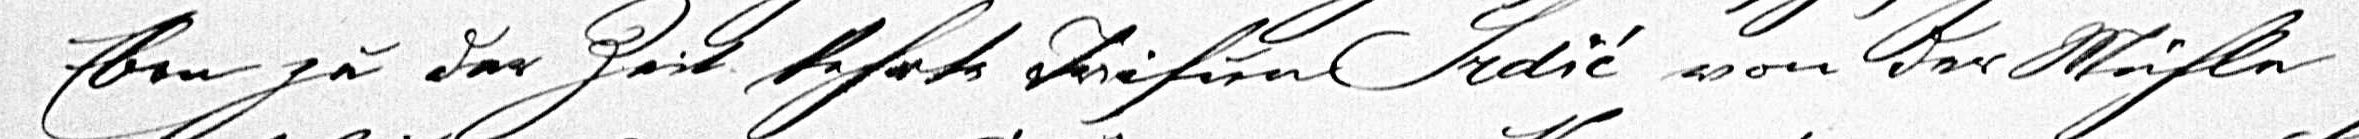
Eben zu der Zeit kehrte Trifun Srdić von der Mühle
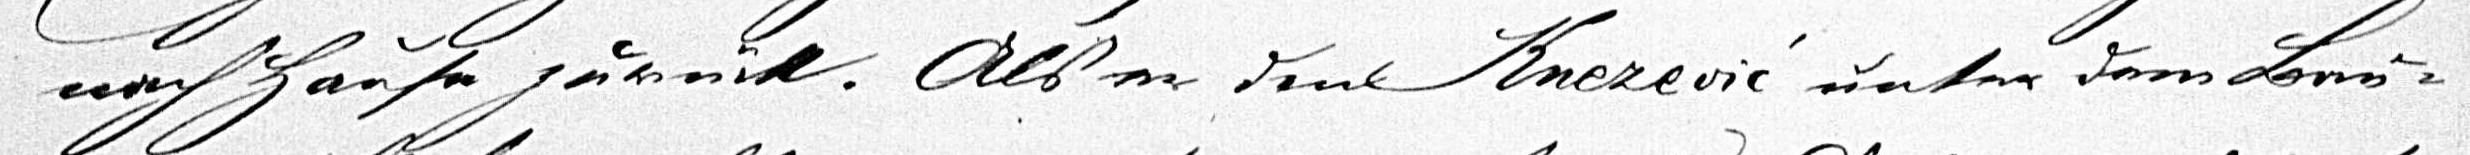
nach Hause zurück. Als er den Knezević unter dem Bau¬
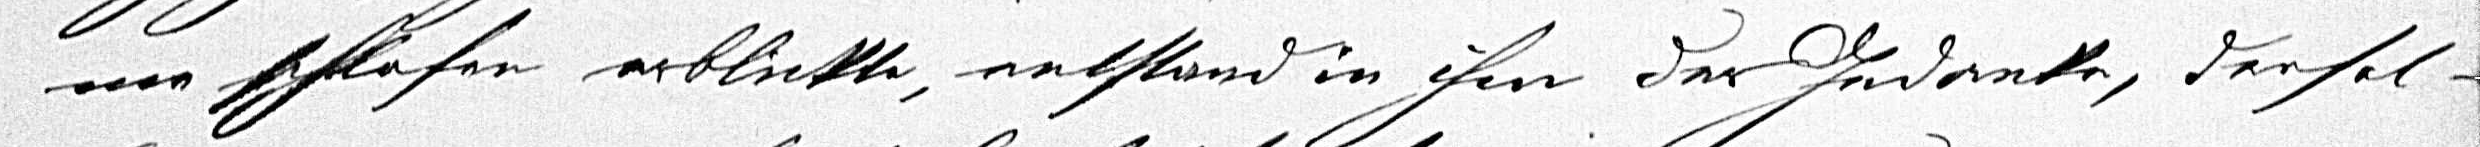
me xx erblickte, entstand in ihm der Gedanke, dersel¬
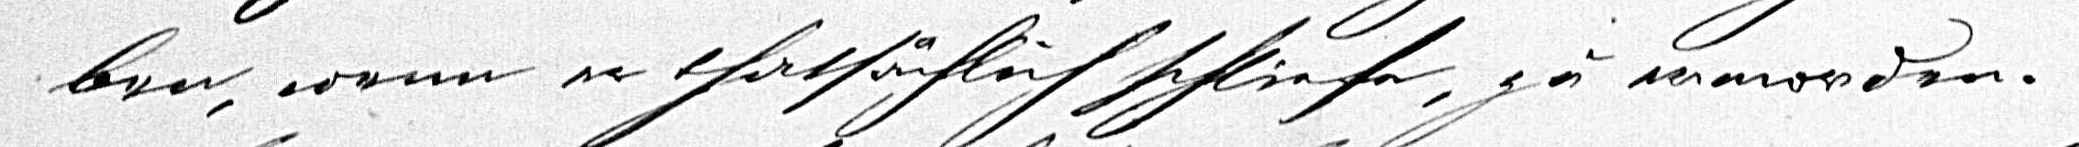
ben, wenn er thatsächlich schliefe, zu ermorden.
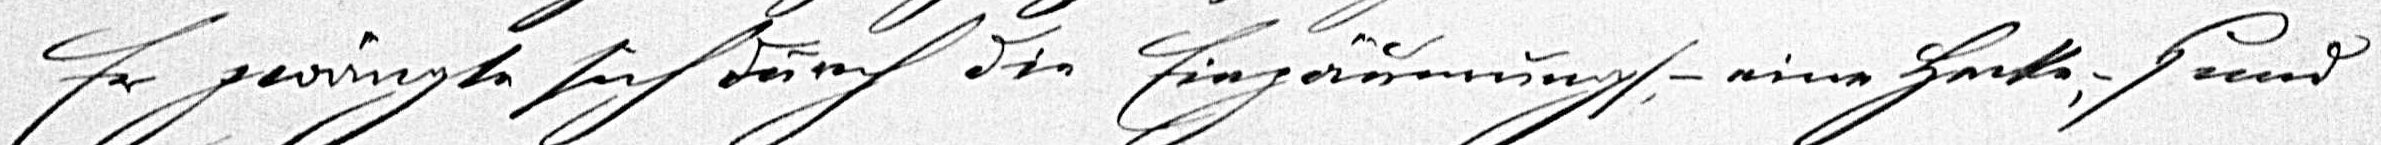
Er zwängte sich durch die Einzäumung /,- eine Hecke,-/ und
